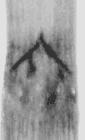六
